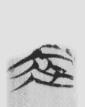{門衣衣}
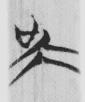吳
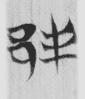邦
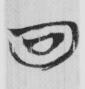回
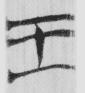王
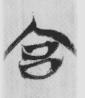宮
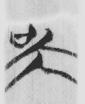吳
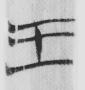王
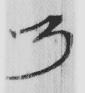乃
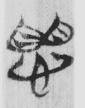{䀠心}
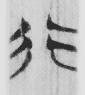行
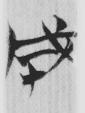成
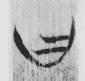曰
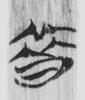昔
